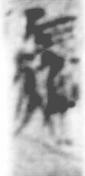○（服）
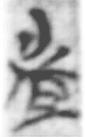益
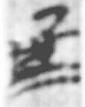爲
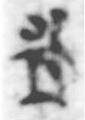○（右）
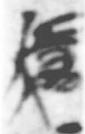驂
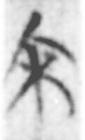宋
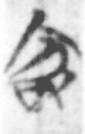客
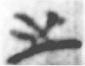之
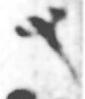又
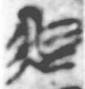飛（騑）
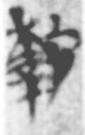新（新）
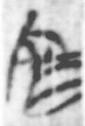官
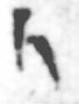人
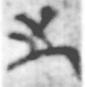之
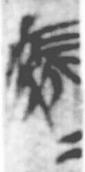六
